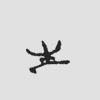生
